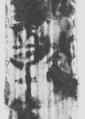{單犬}
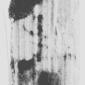之
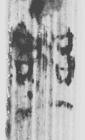{器土}
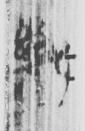幾
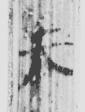亓
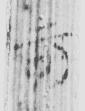可
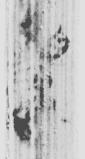靜
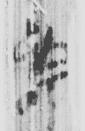於
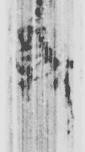獸
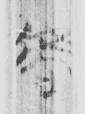唬
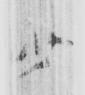少
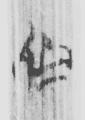於
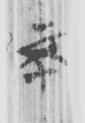不
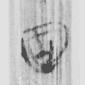固
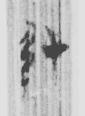引
